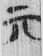亓（其）
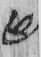臣
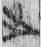之
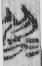溺
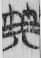典
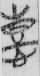○（喜）
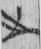之
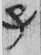子
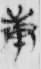庚
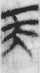一夫
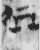凥
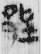郢
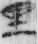里
